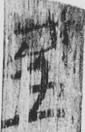○（吾）
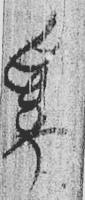○（奚）
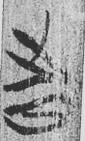旹（待）
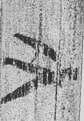之
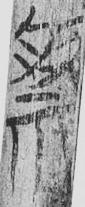祭
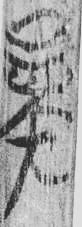員
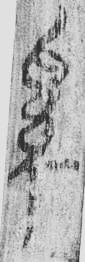○（奚）
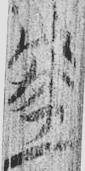○（吾）
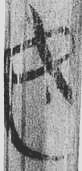女（如）
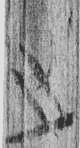之
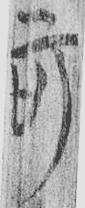可（何）
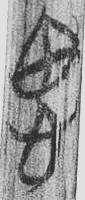思（使）
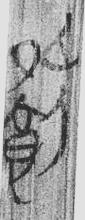○（飽）
